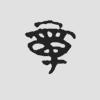章
